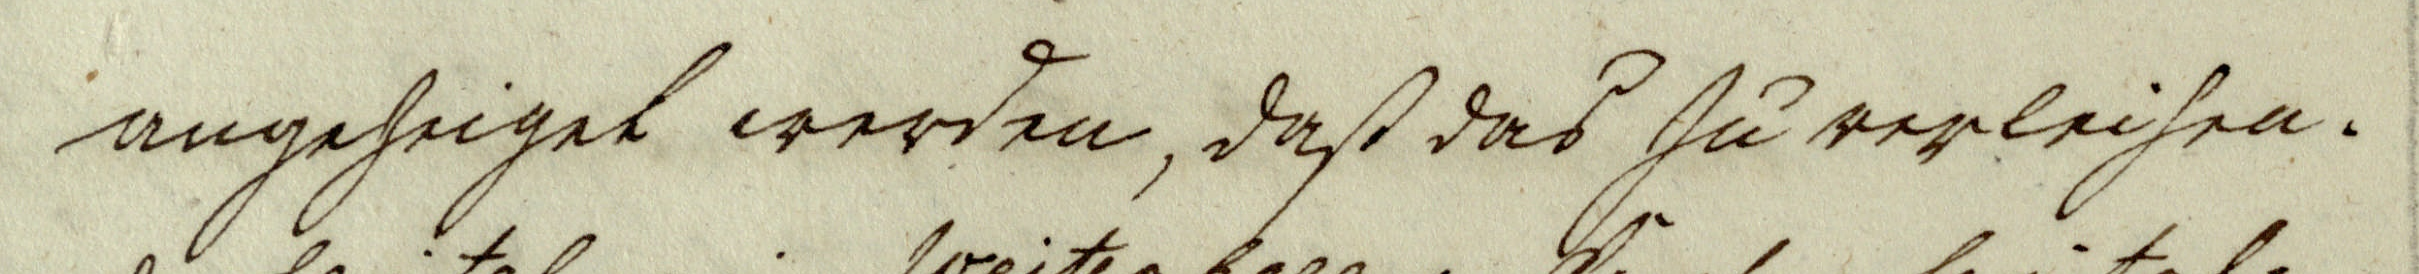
angezeiget werden, daß das zu verleihen¬
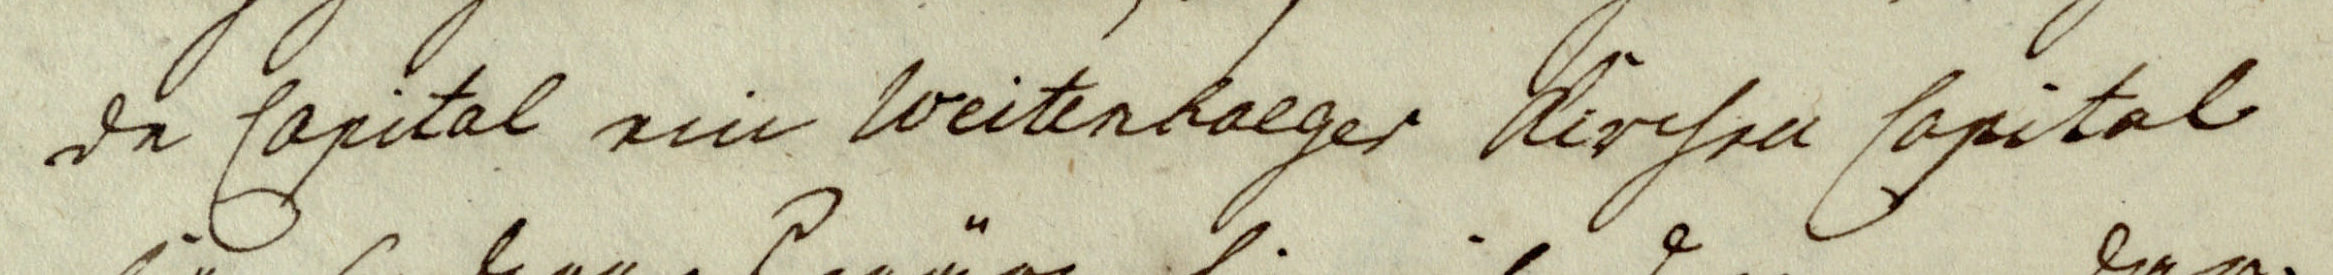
de Capital ein Weitenhaeger Kirchen Capital
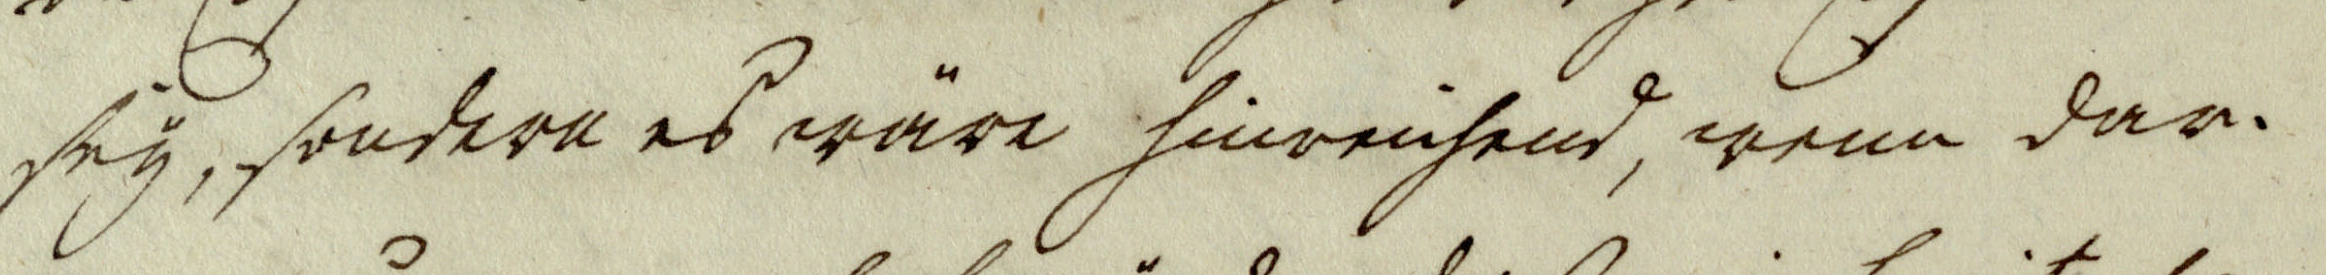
seÿ, sondern es wäre hinreichend, wenn dar¬
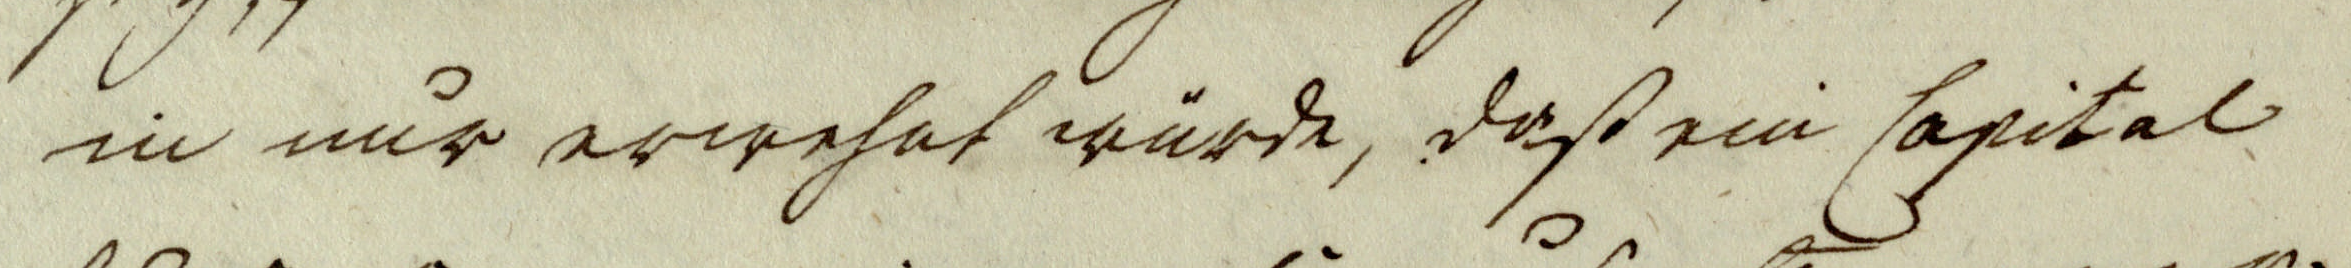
in nur erwehnt würde, daß ein Capital
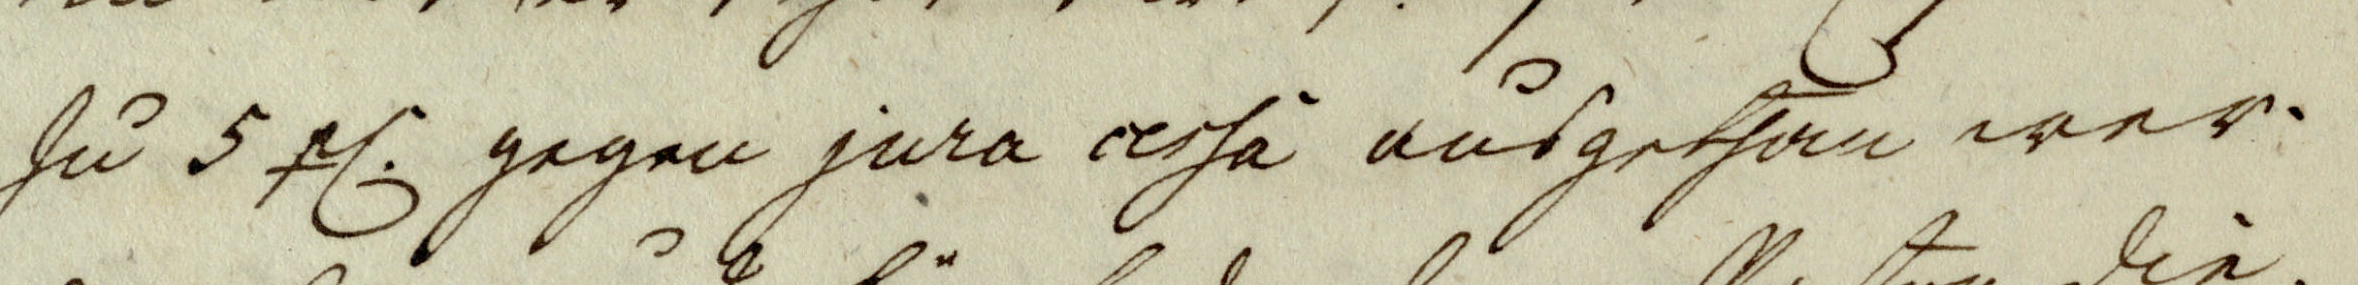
zu 5 pl. gegen jura cessa ausgethan wer¬
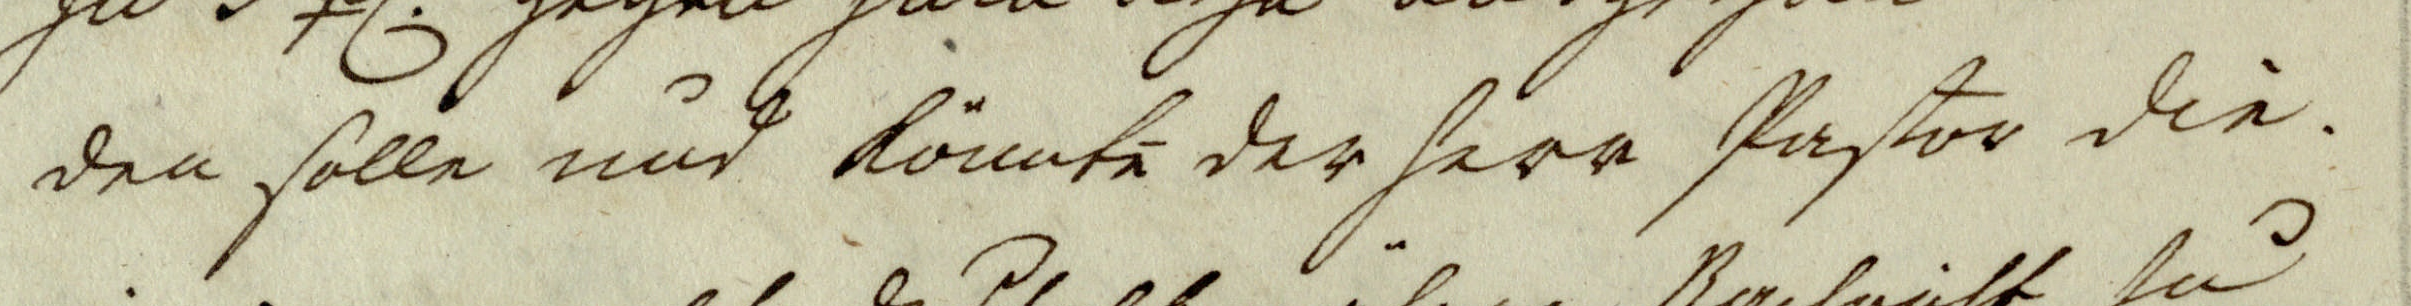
den solle und könnte der Herr Pastor die¬
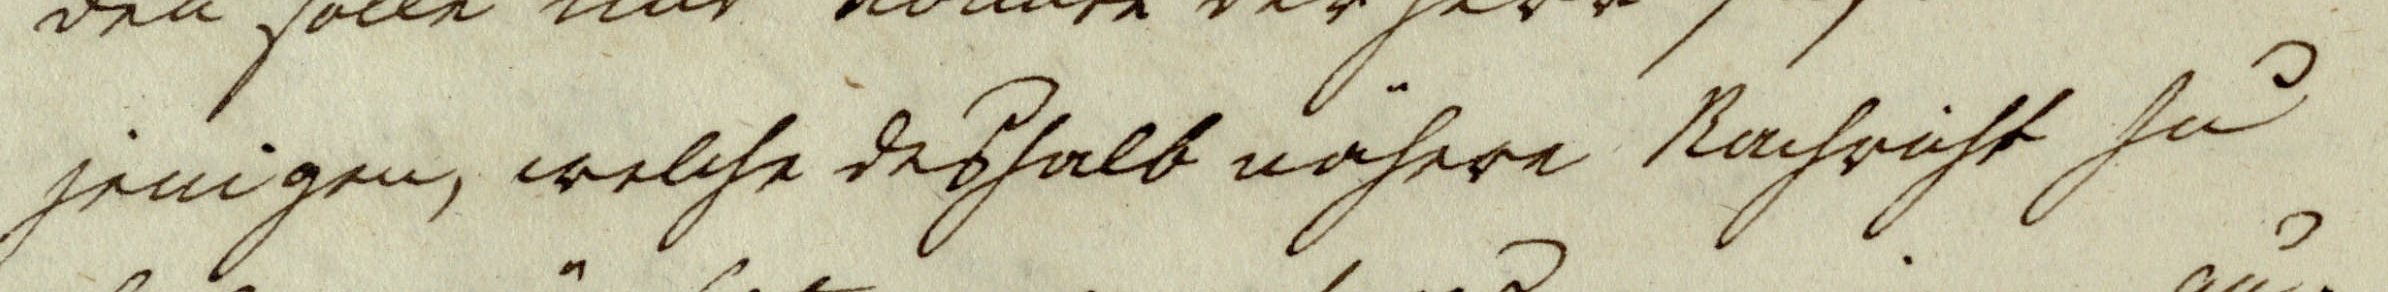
jenigen, welche deshalb nähere Nachricht zu
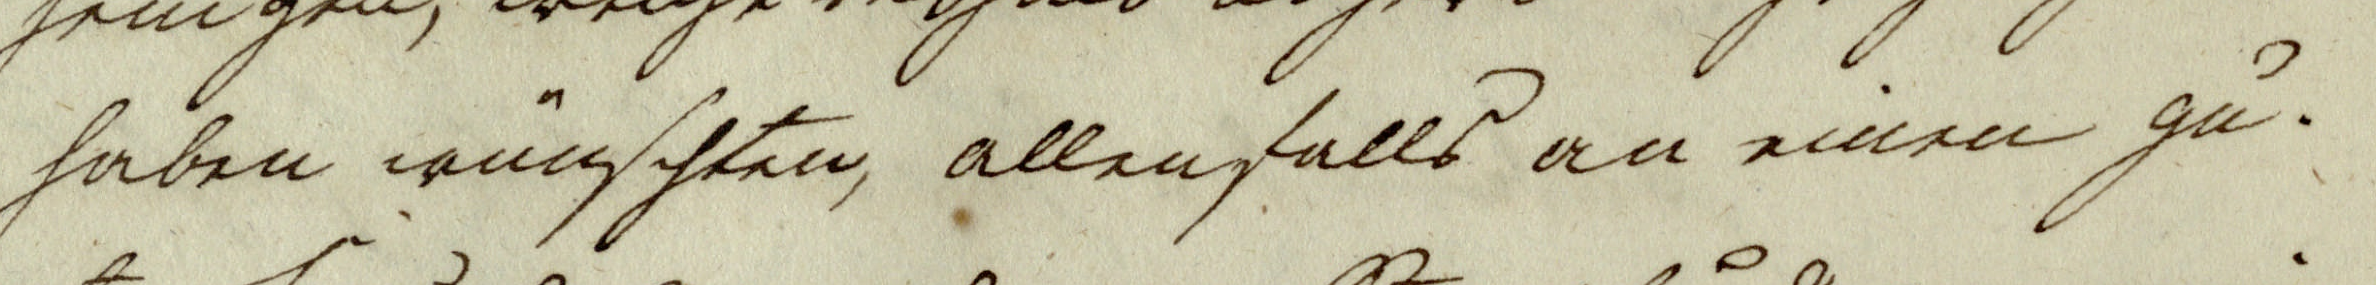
haben wünschten, allenfalls an einen gu-
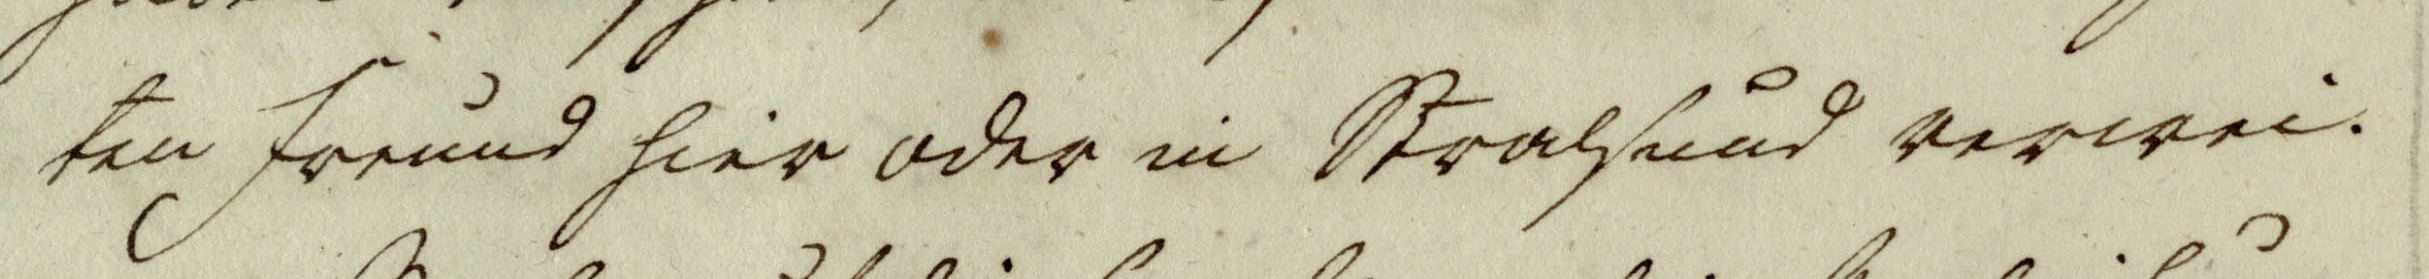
ten Freund hier oder in Stralsund verwei¬
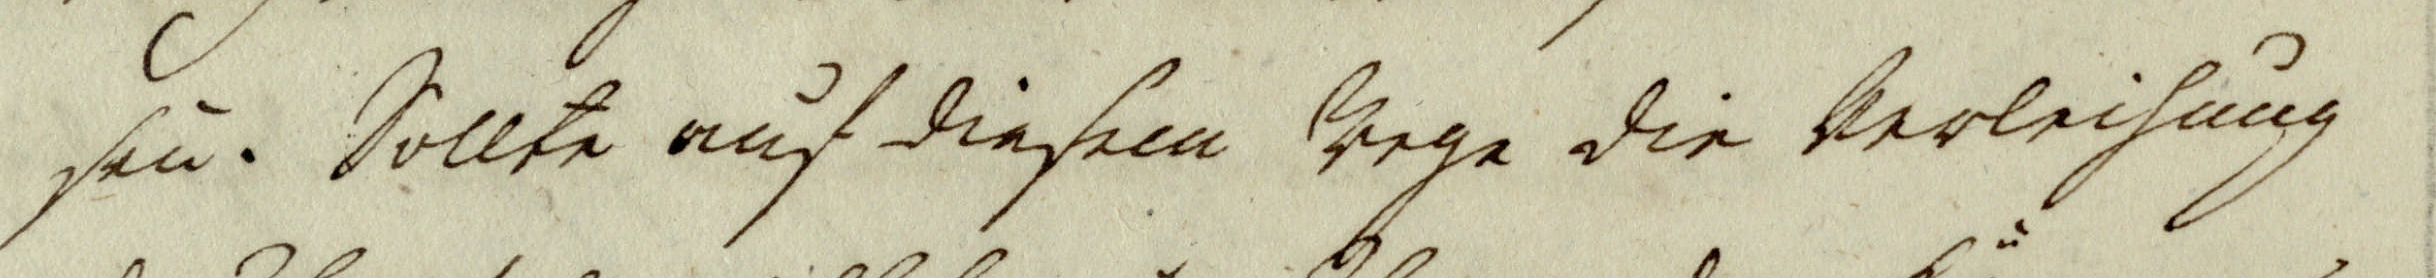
sen. Sollte auf diesem Wege die Verleihung
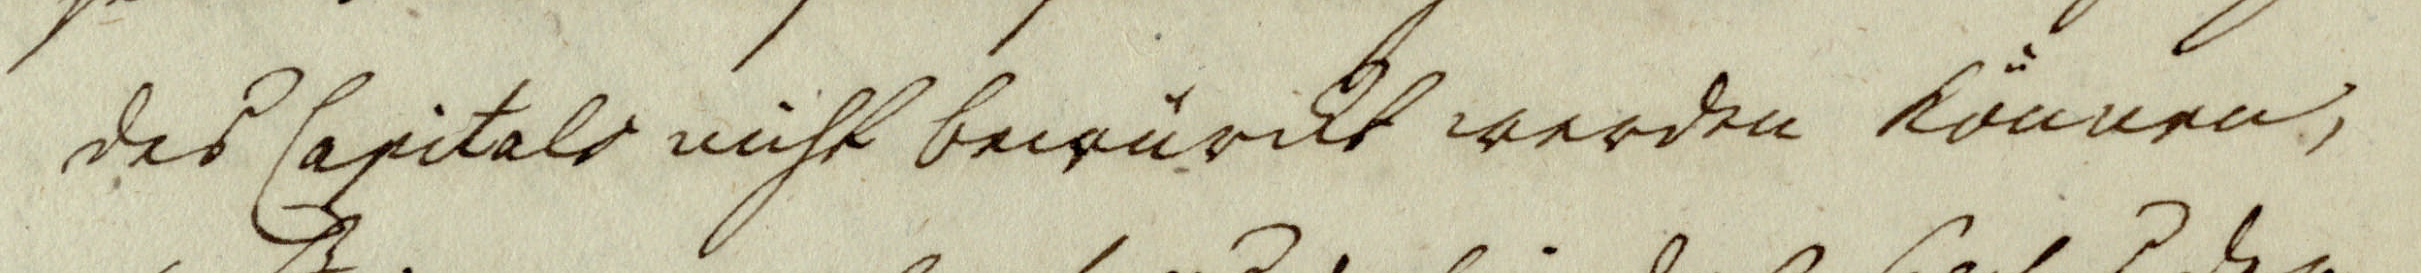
des Capitals nicht bewürckt werden können,
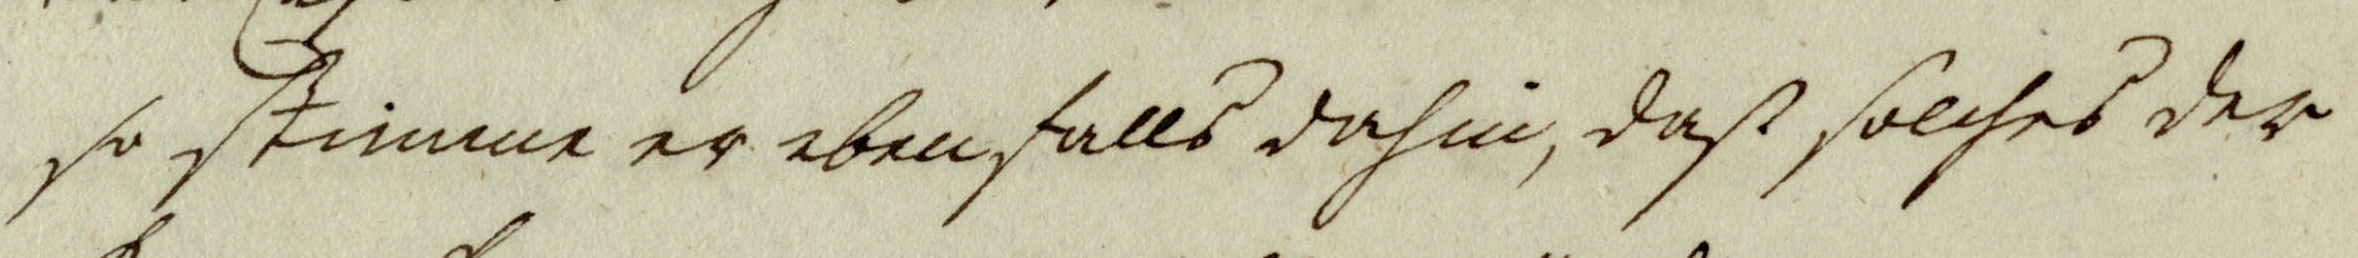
so stimme er ebenfalls dahin, daß solches der
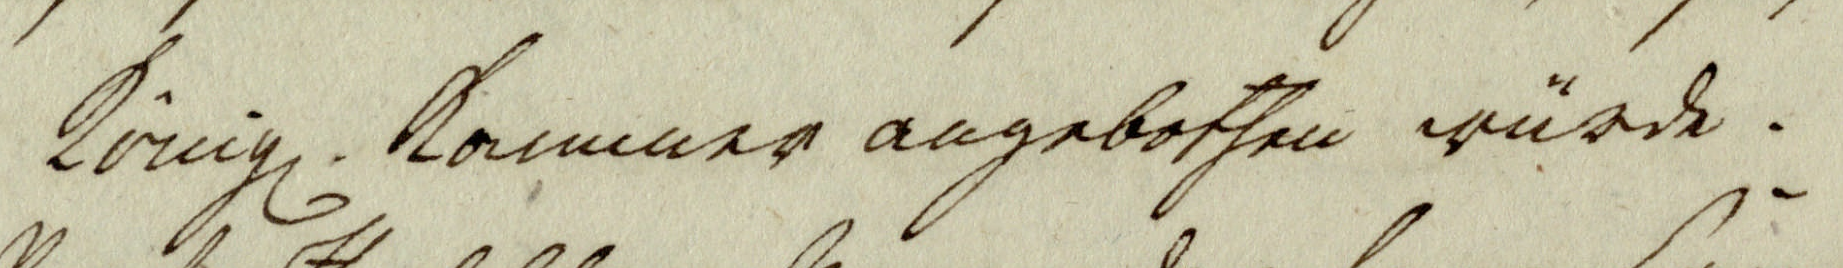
Königl. Kammer angebothen würde.
